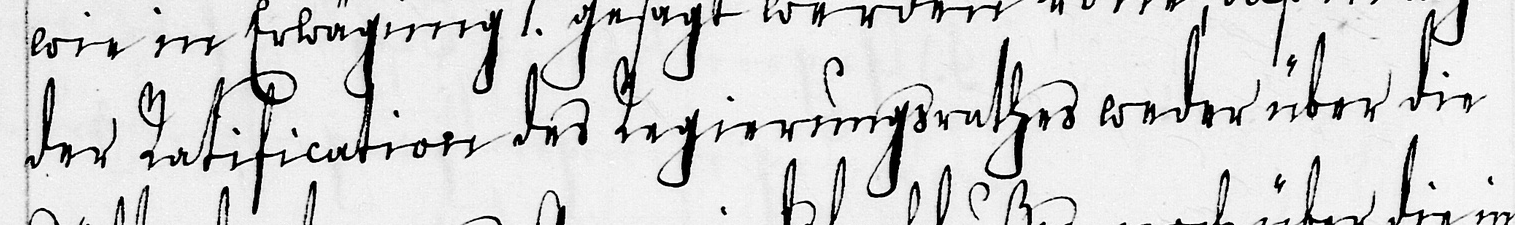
der Ratification des Regierungsrathes weder über die
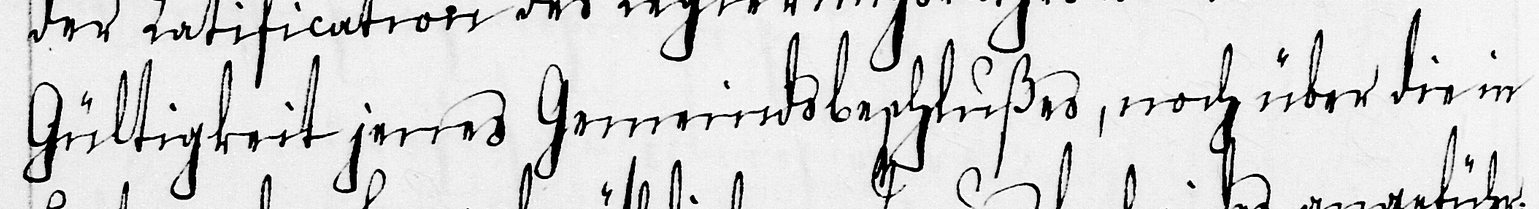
Gültigkeit jenes Gemeindsbeschlußes, noch über die in
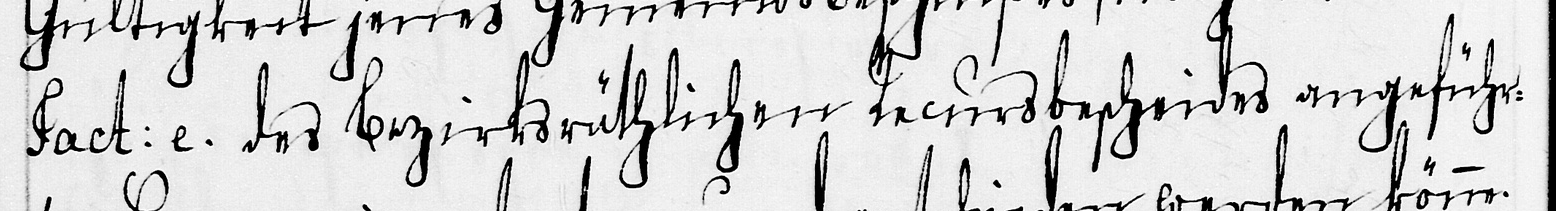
Fact: e. des bezirksräthlichen Recursbescheides angeführ¬
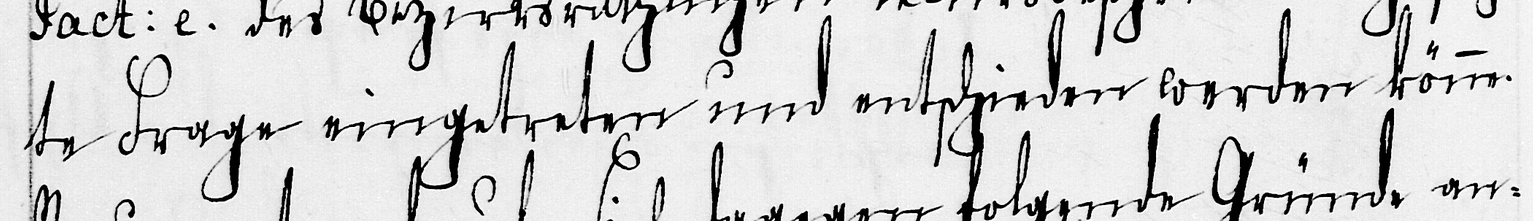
te Frage eingetreten und entschieden werden könne.
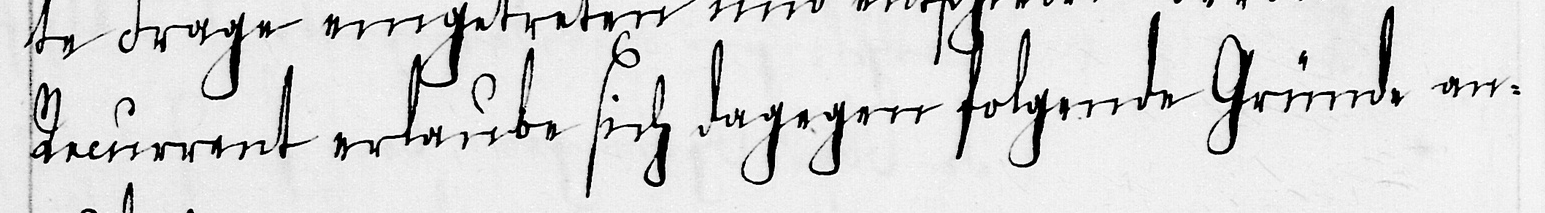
Recurrent erlaube sich dagegen folgende Gründe an¬
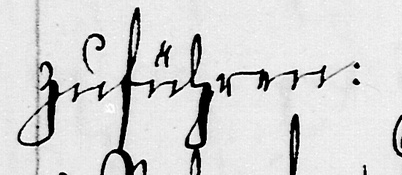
zuführen:
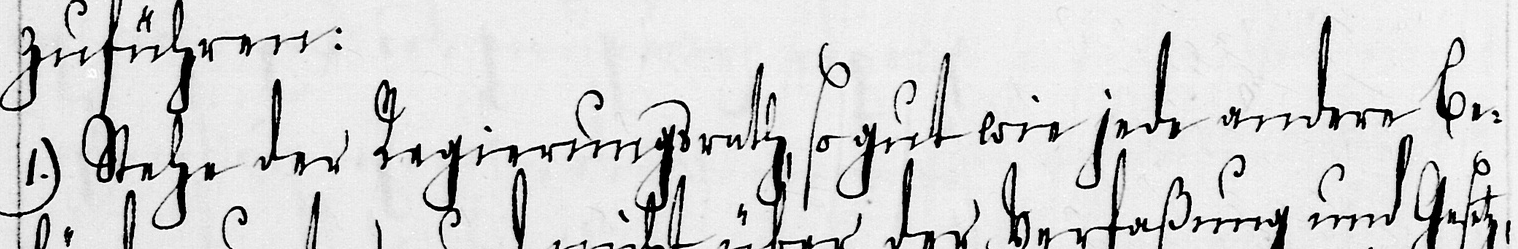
1.) Stehe der Regierungsrath, so gut wie jede andere Be¬
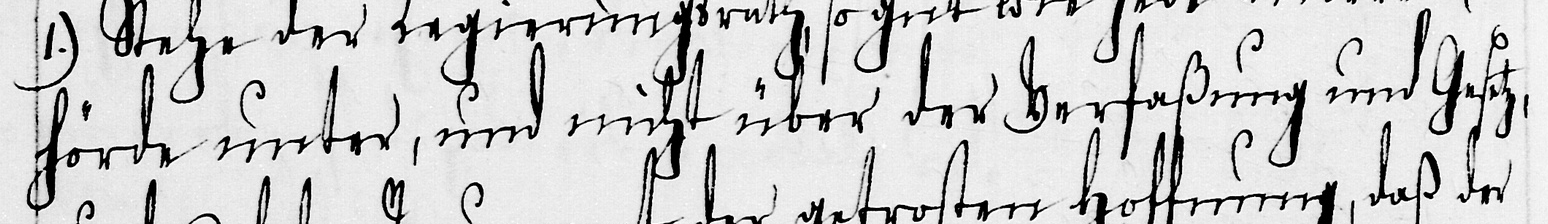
hörde unter, und nicht über der Verfaßung und Ge¬
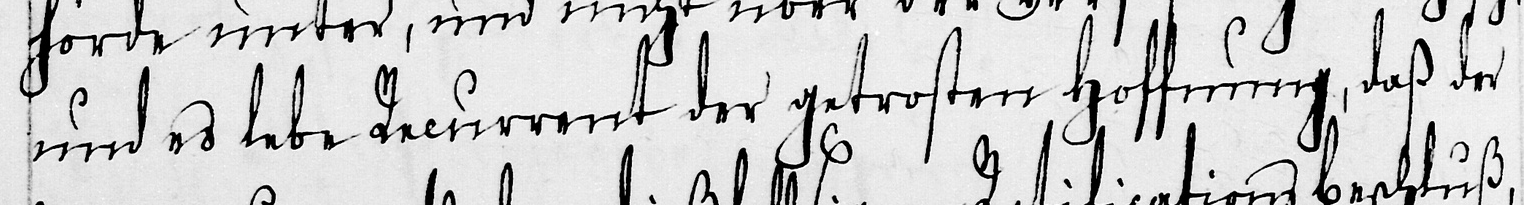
und es habe Recurrent der getrosten Hoffnung, daß der
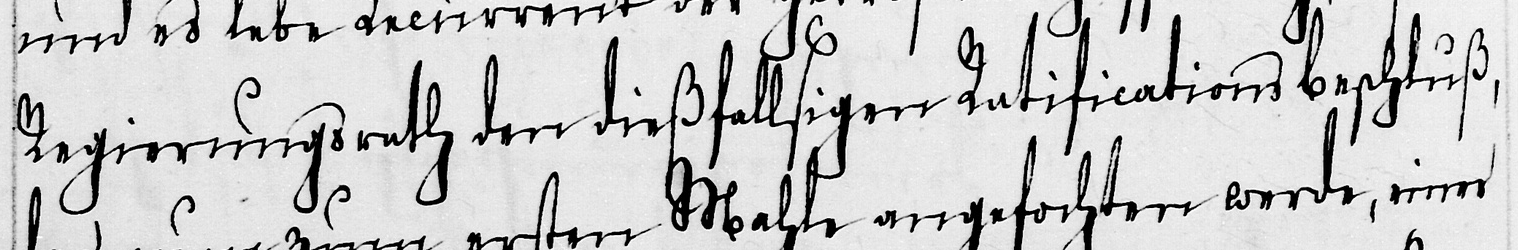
Regierungsrath den dießfalligen Ratificationsbeschluß,
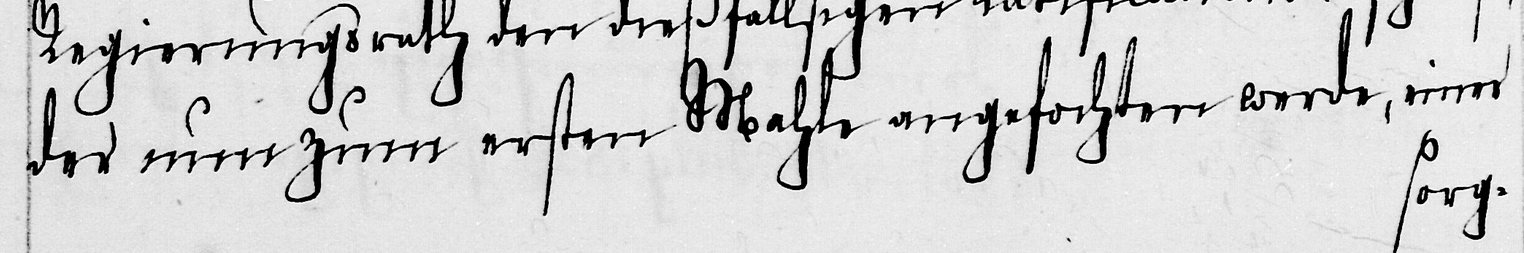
der nun zum ersten Mahle angefochten werde, einer
